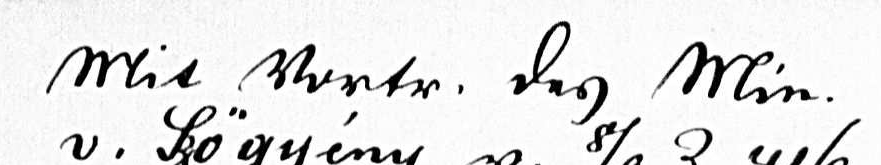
Mit Vortr. des Min.
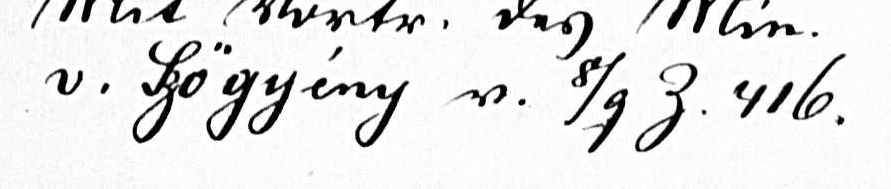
v. Szögyény v. 8/9 Z. 416
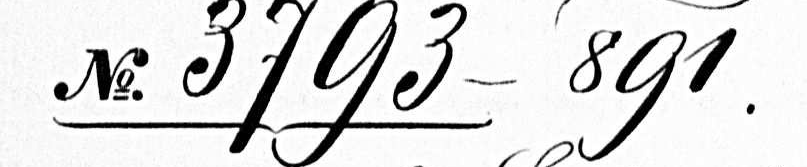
No. 3793 - 1891
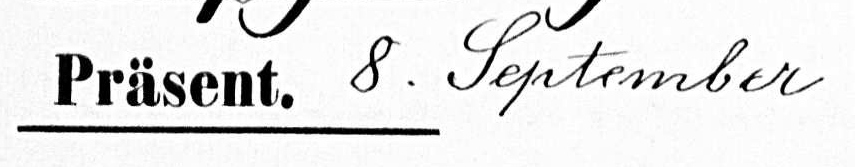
Präsent. 8. September
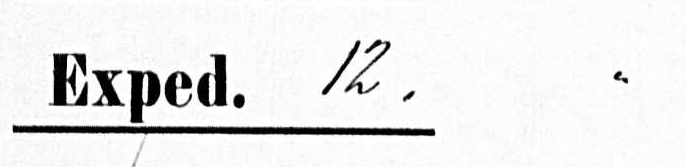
Exped. 12. „
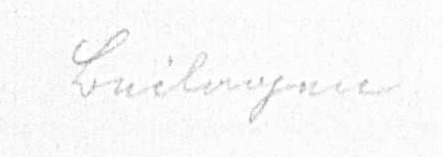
Beilagen
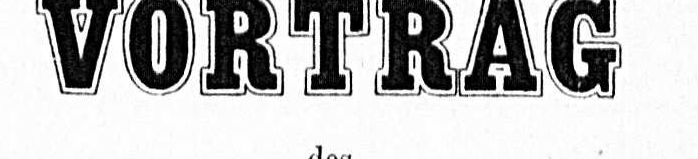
VORTRAG
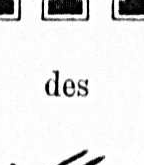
des
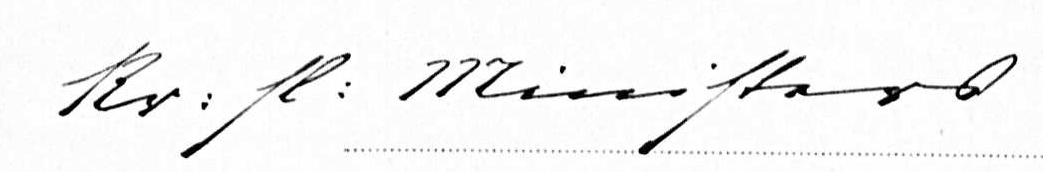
kr. sl. Ministers
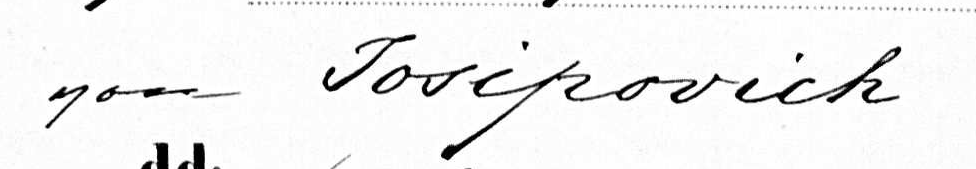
von Josipovich
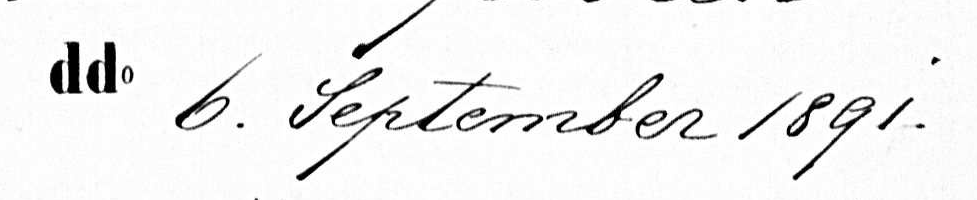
ddo 6. September 1891
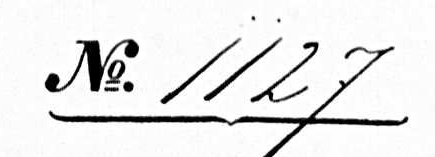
No. 1127
